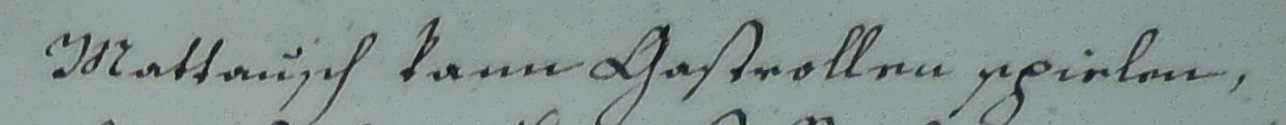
Mattausch kann Gastrollen spielen,
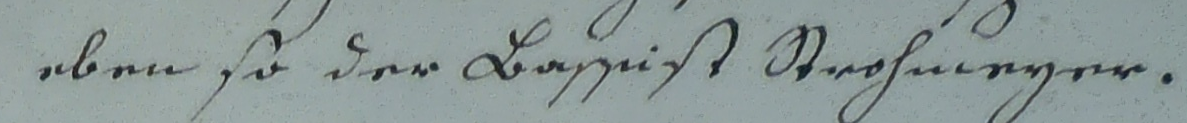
eben so der Bassist Strohmeyer.
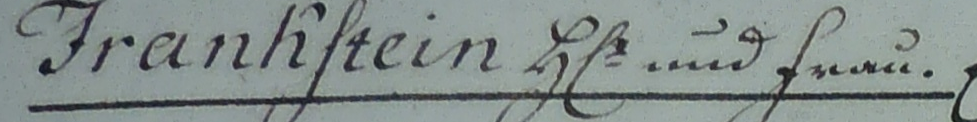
Frankstein HEr͇ und Frau.
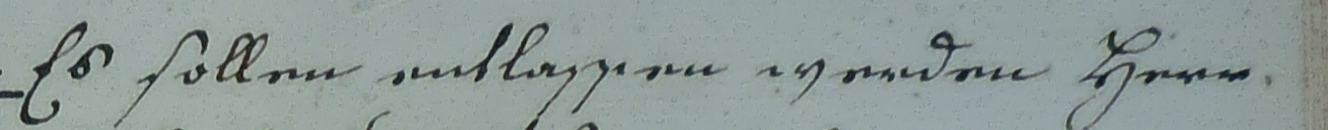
Es sollen entlassen werden Herr
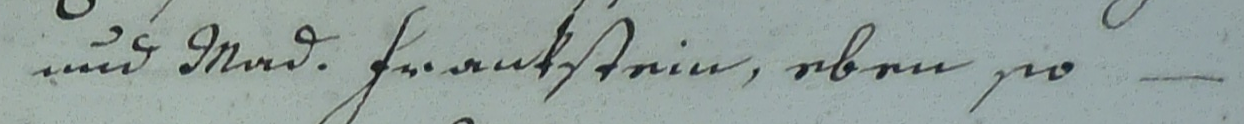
und Mad. Frankstein, eben so ____
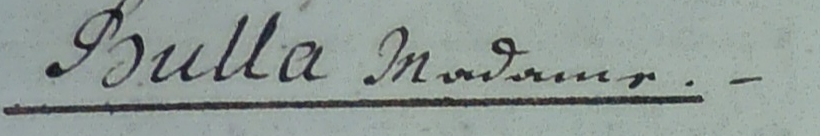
Bulla Madame. -
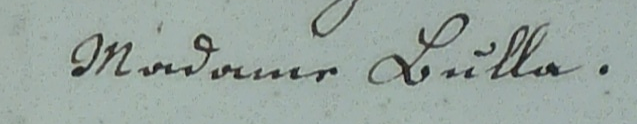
Madame Bulla.
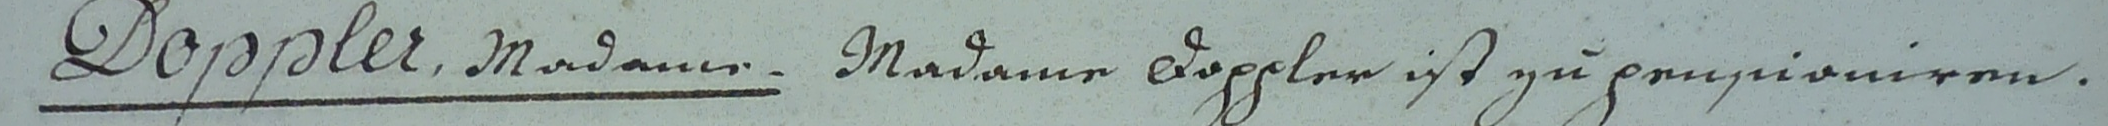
Doppler, Madame . Madame Doppler ist zu pensioniren.
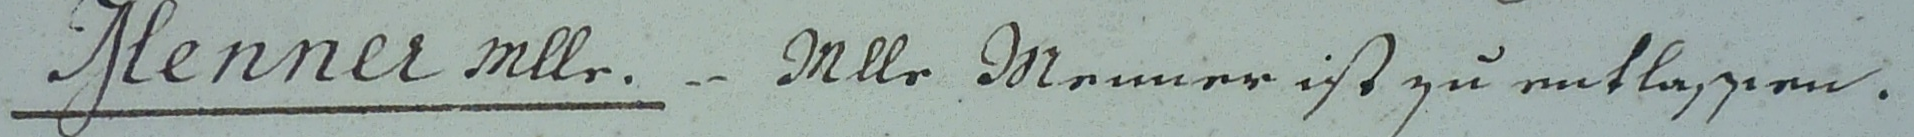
Menner Mlle. : Mlle Menner ist zu entlassen.
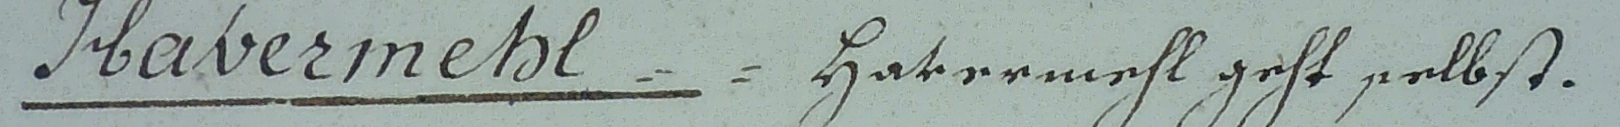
Havermehl : : Havermehl geht selbst.
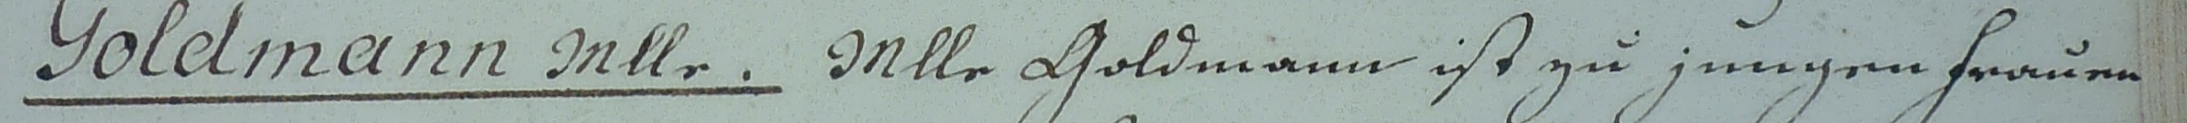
Goldmann Mlle. Mlle Goldmann ist zu jungen Frauen
